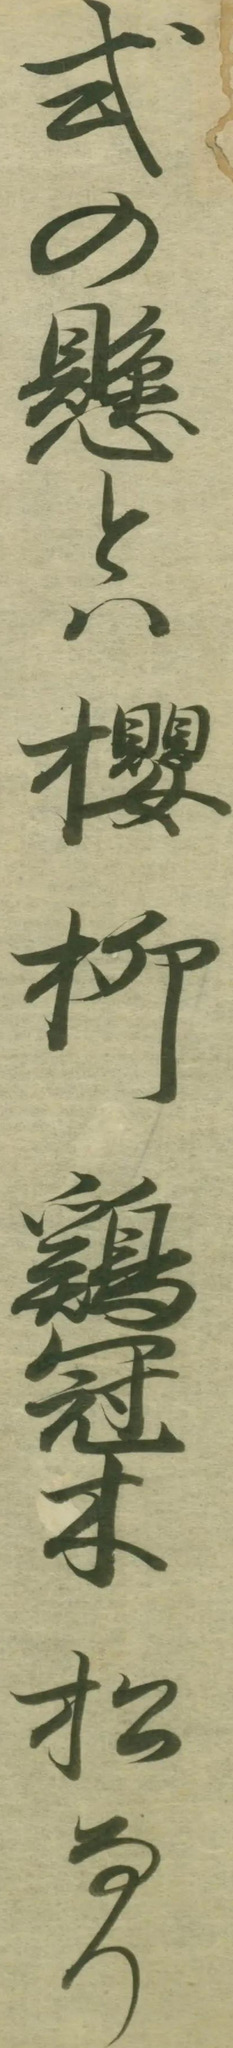式の懸とは桜柳鶏冠木松なり
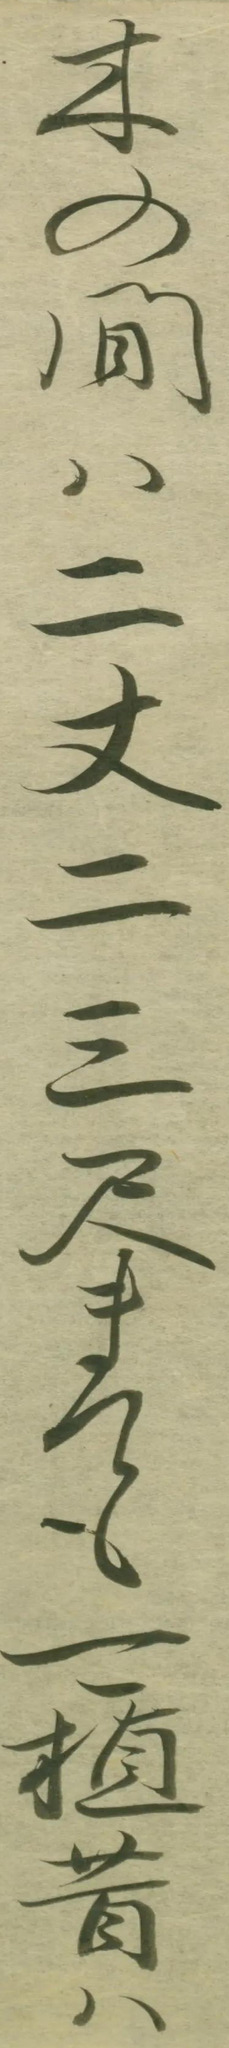木の間は二丈二三尺まても可植昔は
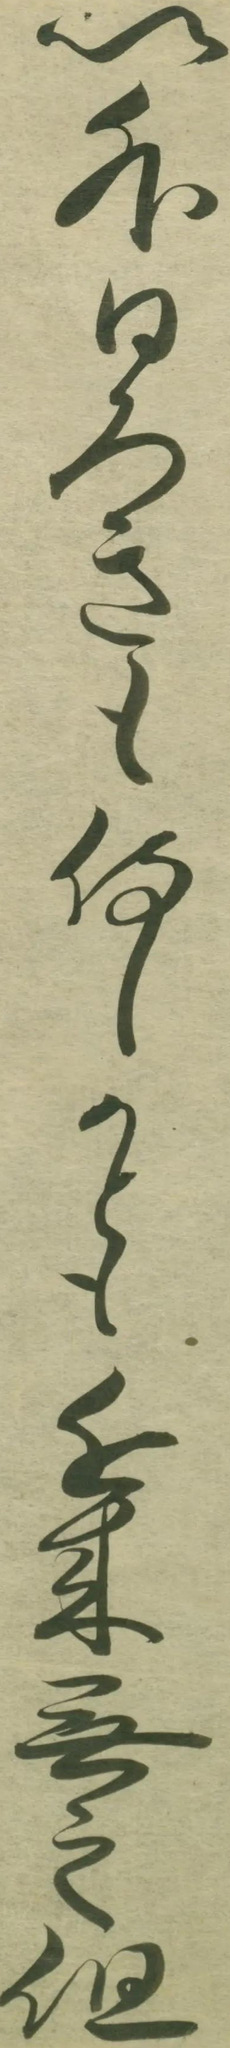以外ひろきも侍しかとも近来無之但
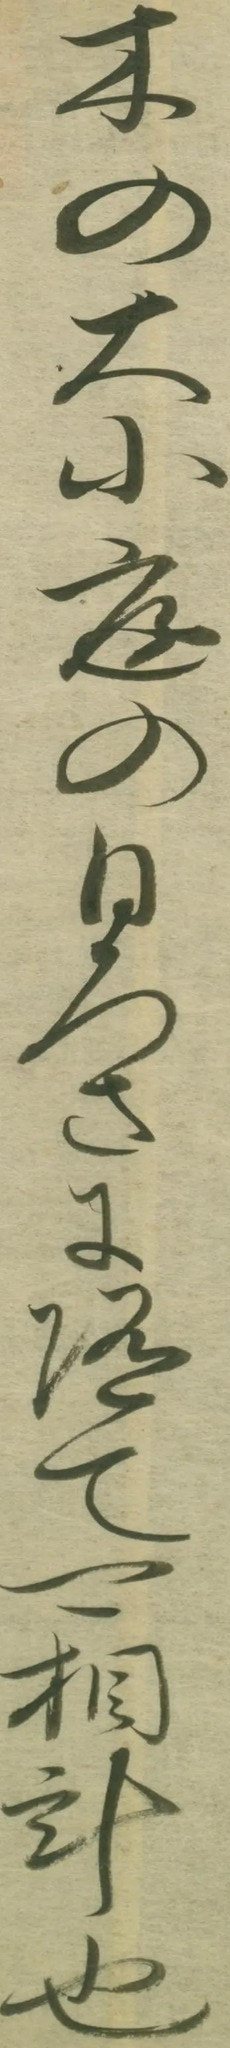木の大小庭のひろさに随て可相計也
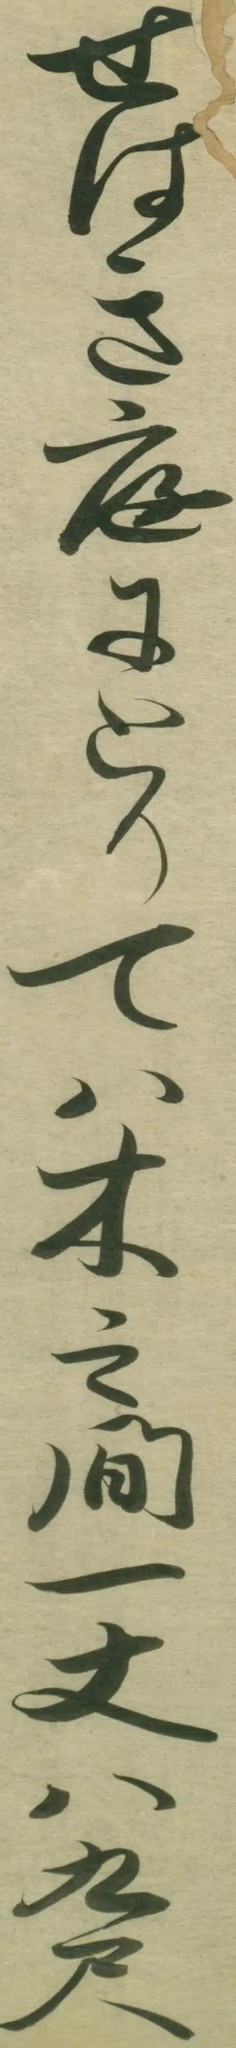せはき庭にとりては木之間一丈八九尺
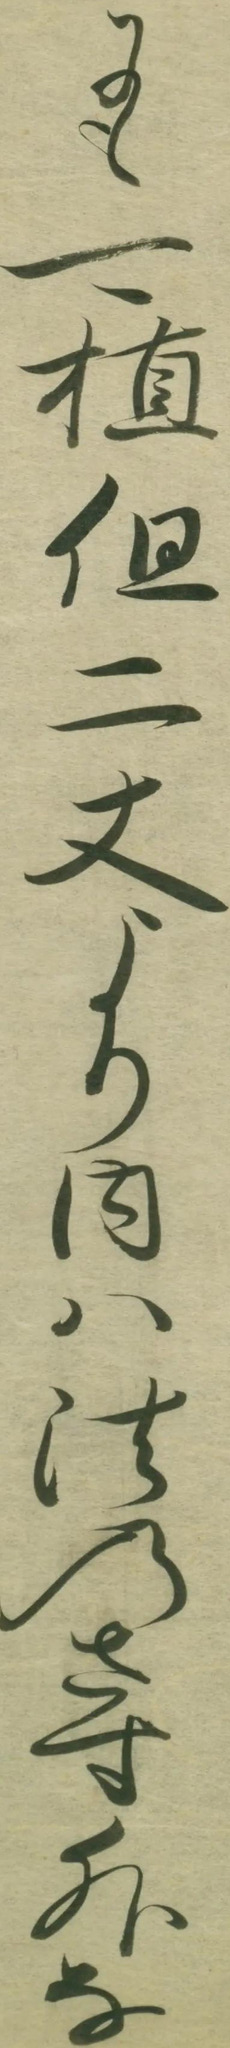にも可植但二丈より内は法のさす外な
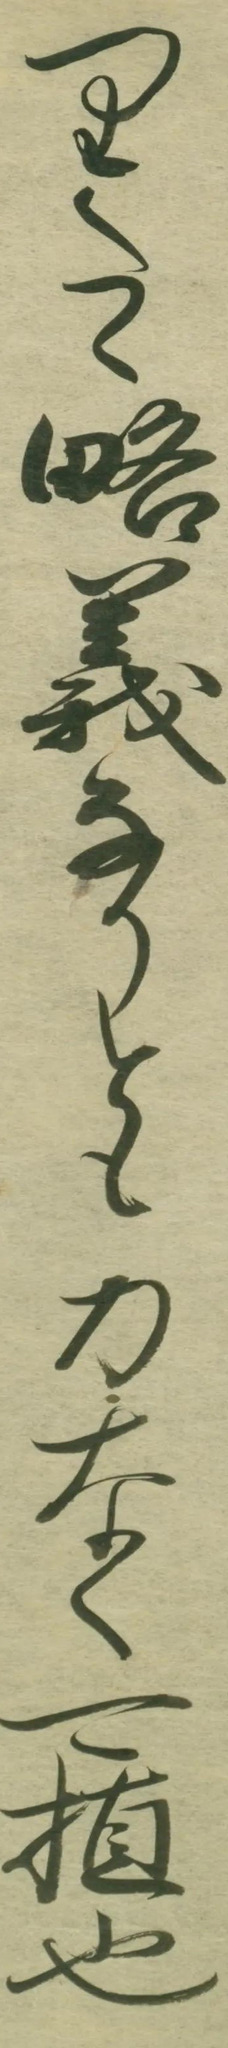りたゝ略義なりとも力なく可植也
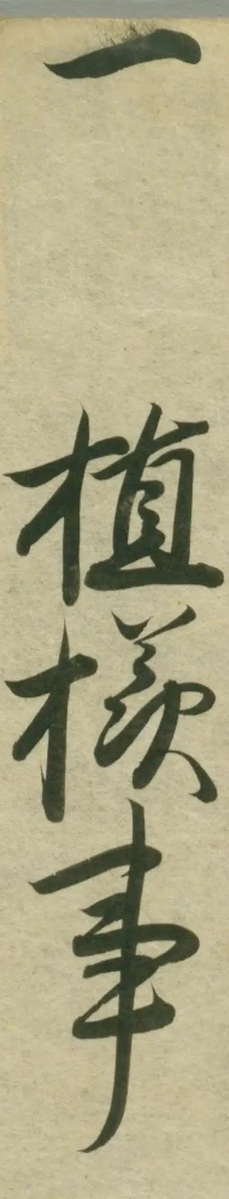一植様事
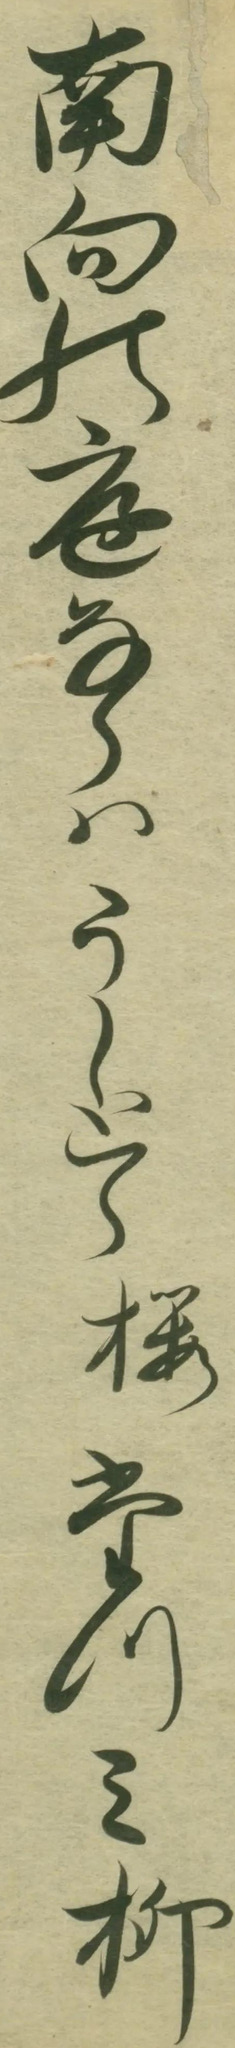南向の庭ならはうしとら桜たつみ柳
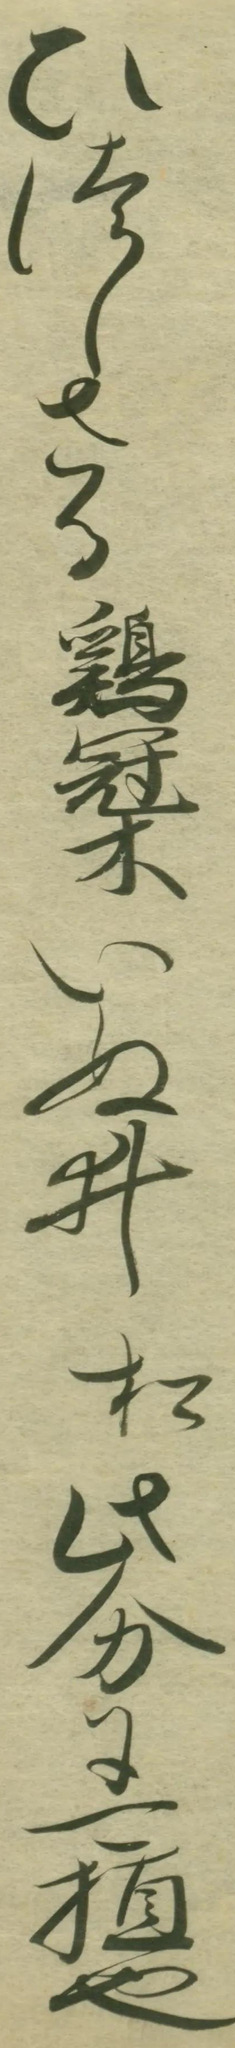ひつしさる鶏冠木いぬゐ松此分に可植也
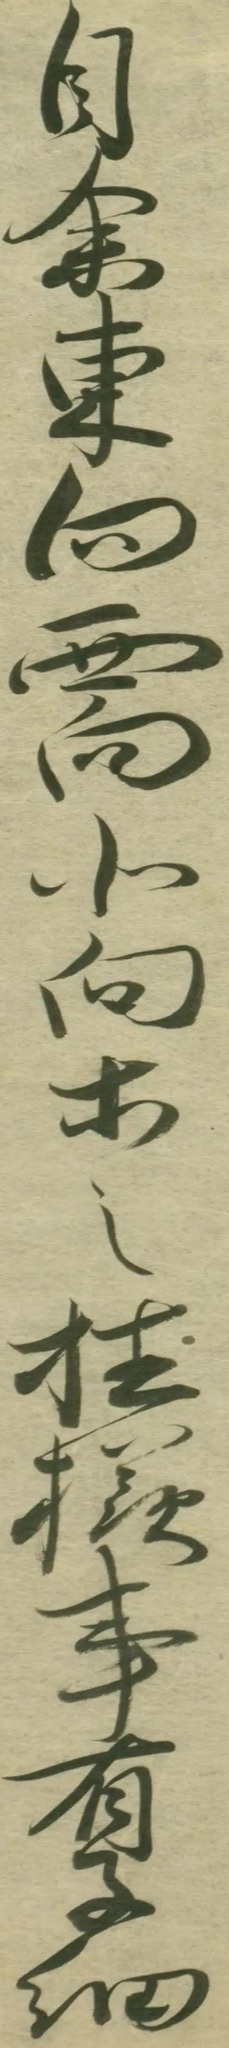自余東向西向北向等之植様事有子細
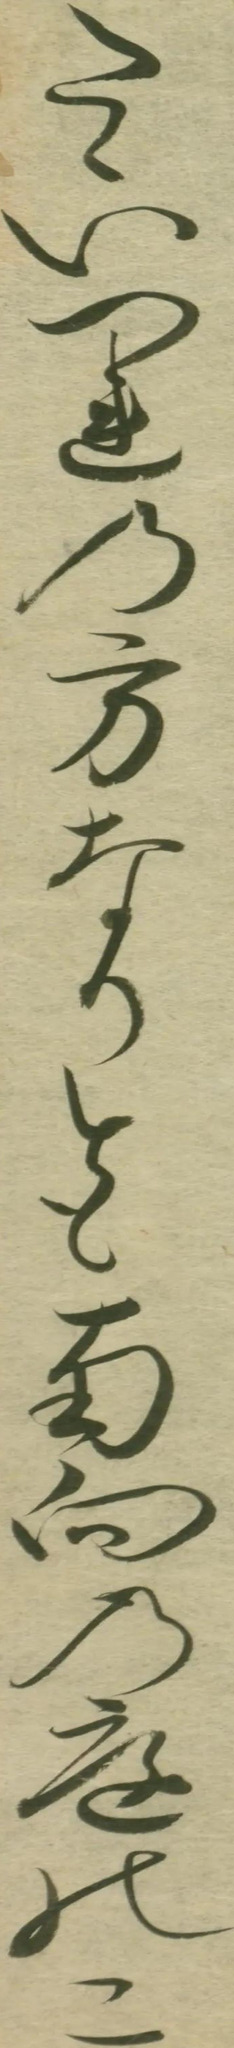たゝいつれの方なりとも南向の庭のこ
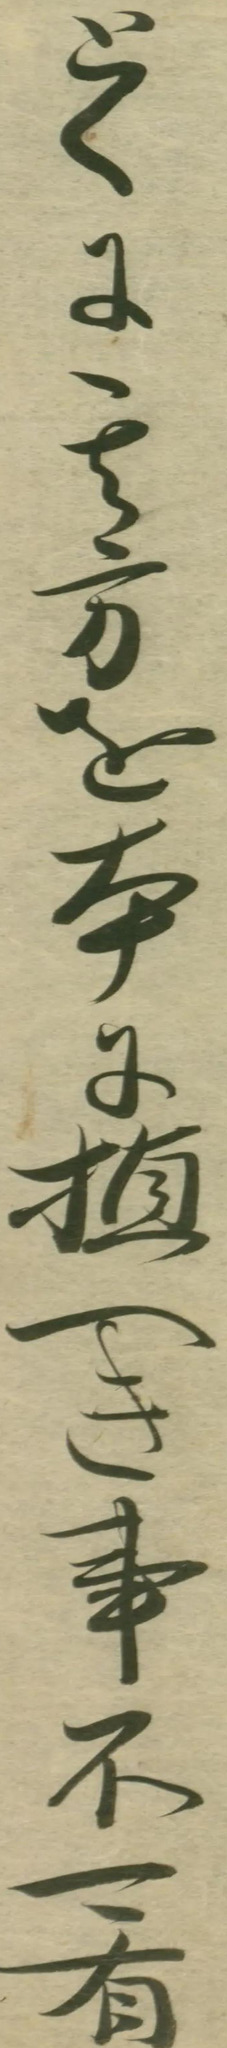とくに其方を本に植へき事不可有
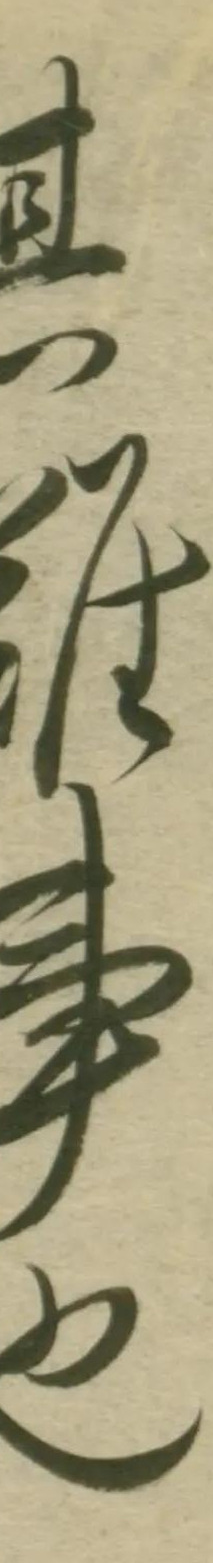其難事也

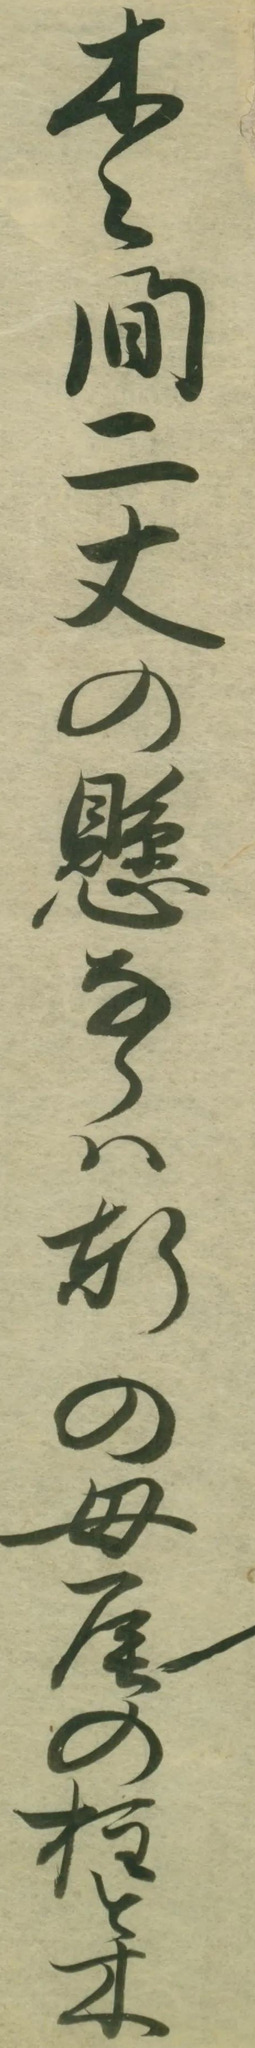木々間二丈の懸ならは軒の母屋の柱と木
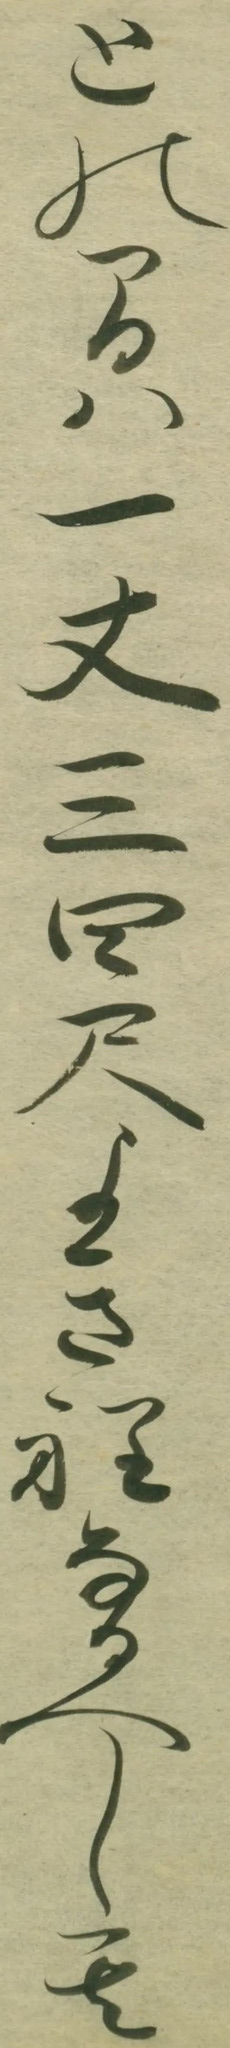との間は一丈三四尺よき程なるへし其
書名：蹴鞠之条々大概
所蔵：国立国会図書館 National Diet Library, JAPAN
